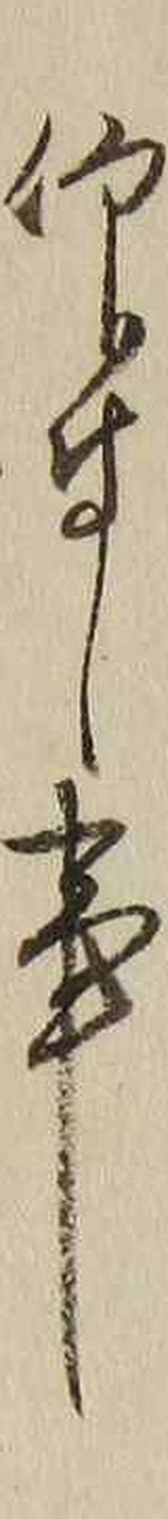仰付候事
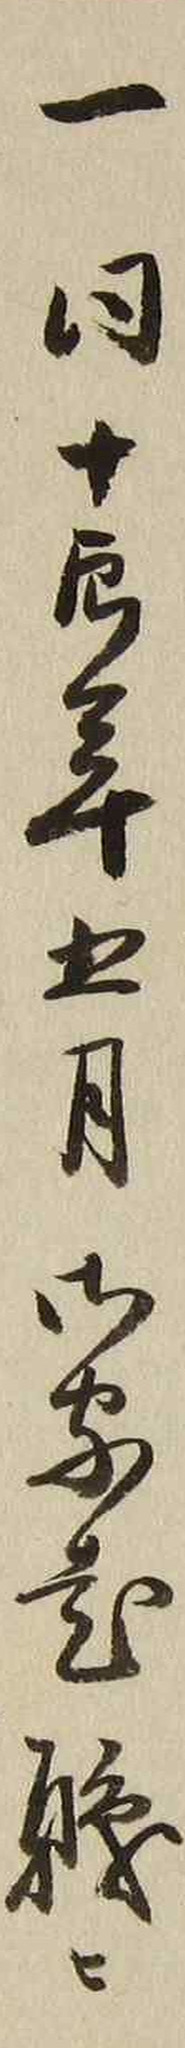一同十辰年五月御家老職被
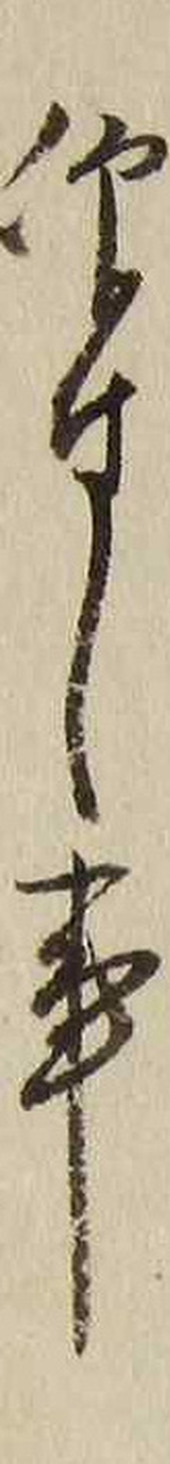仰付候事
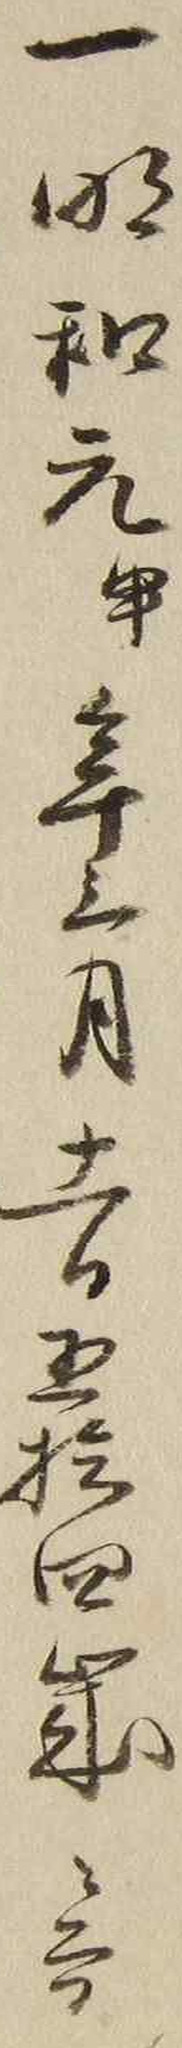一明和元申年三月十一日五拾四歳に而
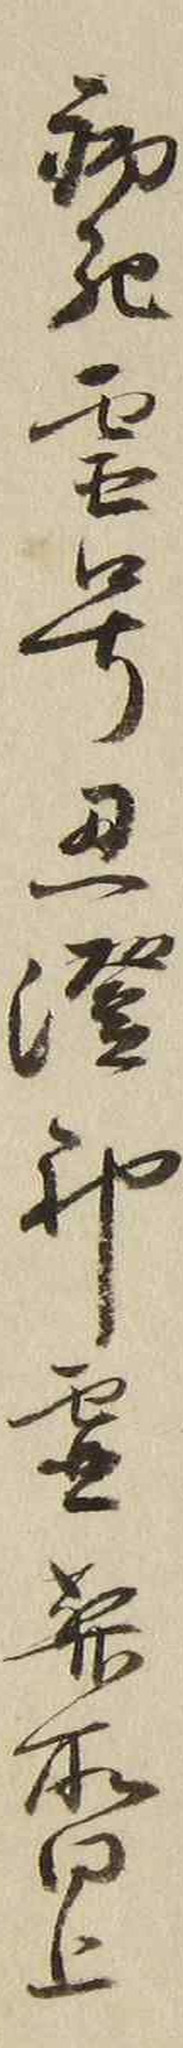病死霊号丑澄神霊葬所同上
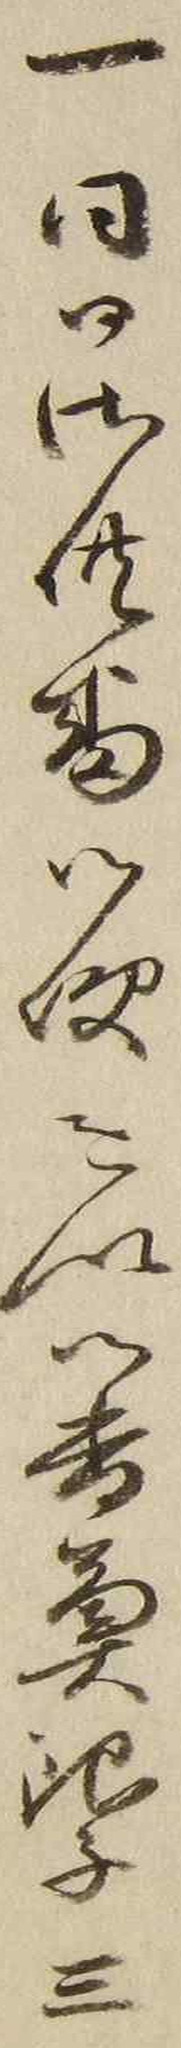一同日御供番御使を以御香典銀子三

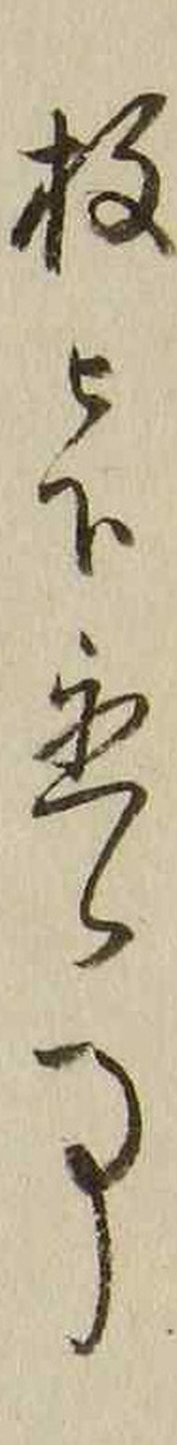枚被下置候事
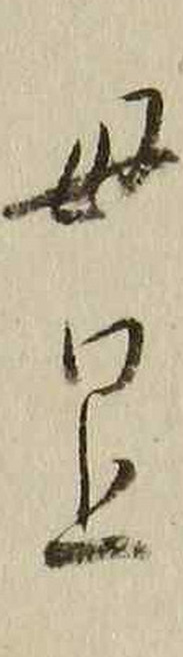母同上
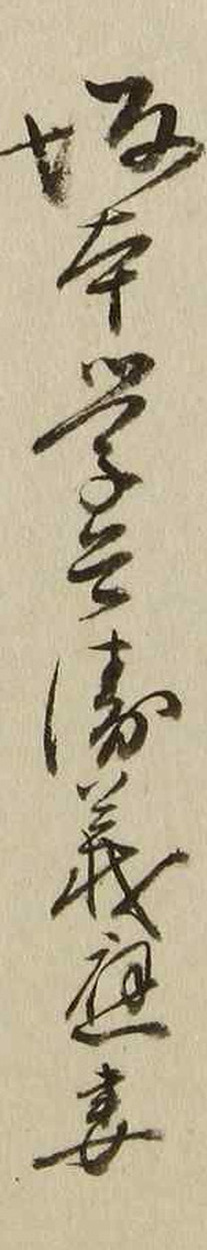女坂本学兵衛義応妻
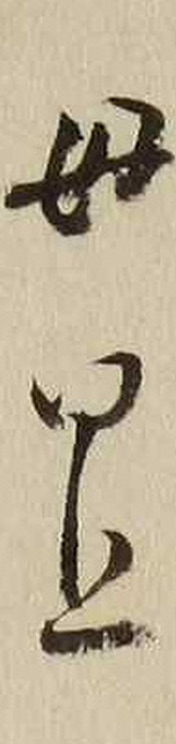母同上
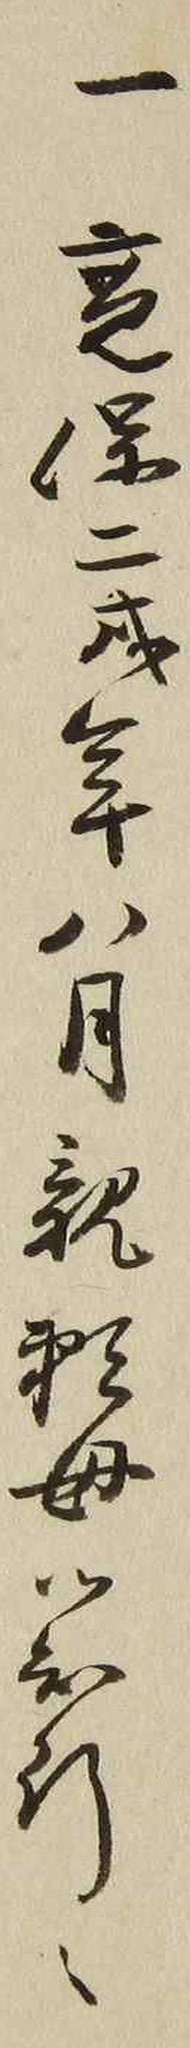一寛保二戌年八月親賴母御知行之
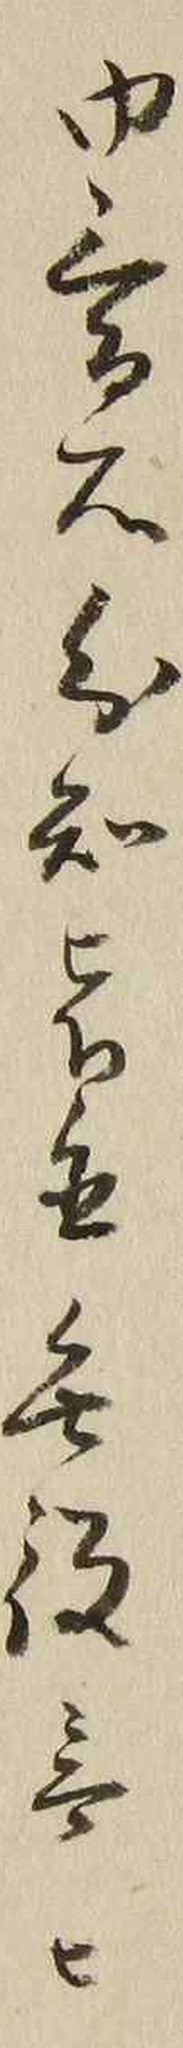内三百石分知被下置無役に而
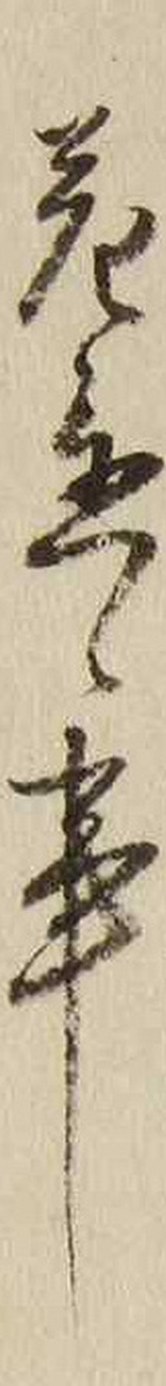差置候事
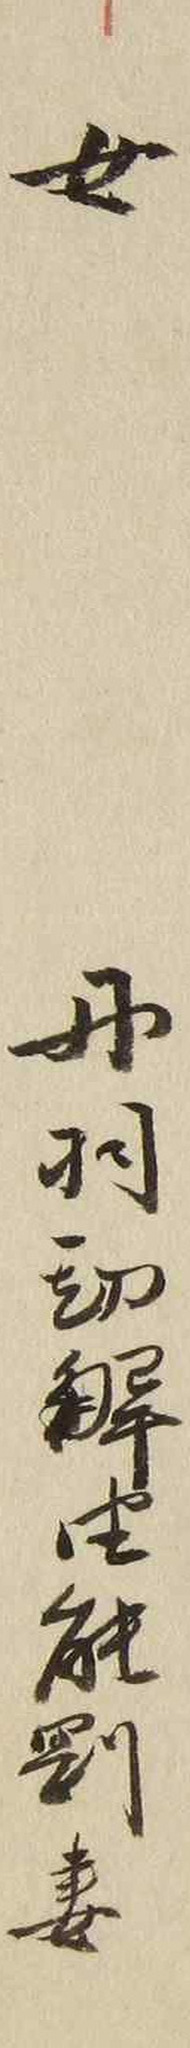女丹羽勘解由能剛妻
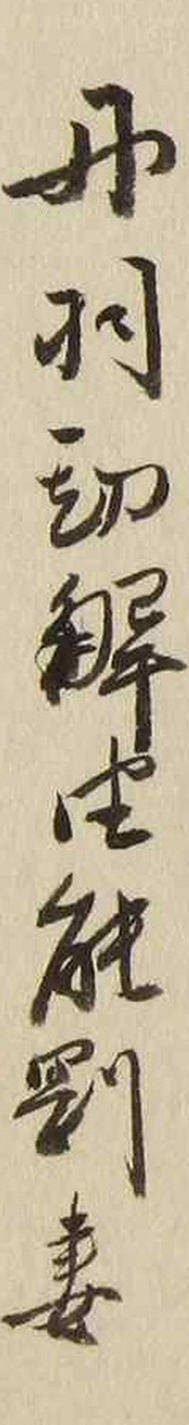女丹羽勘解由能剛妻

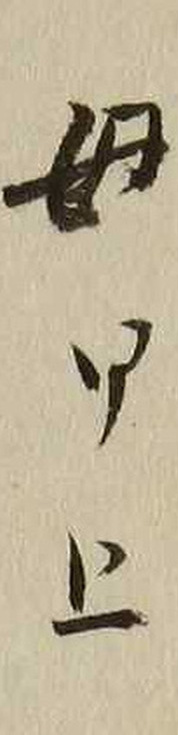母同上
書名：諸士系譜　巻之269　さ之部1
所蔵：会津若松市立会津図書館
